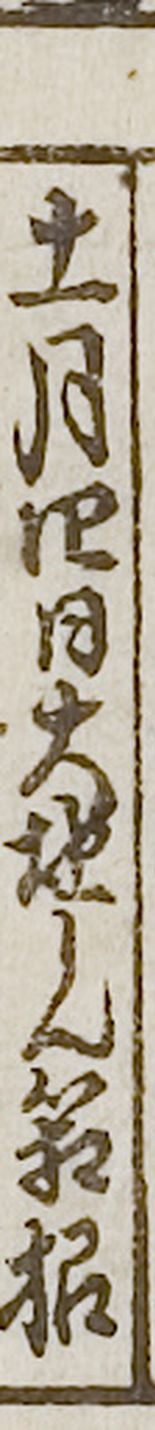十一月四日大地しん箱根
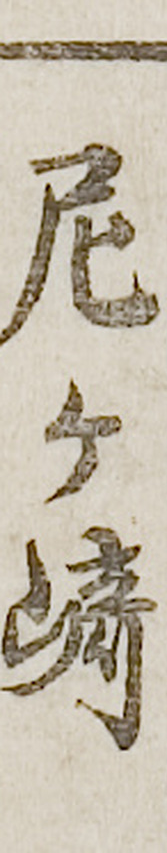尼ケ崎
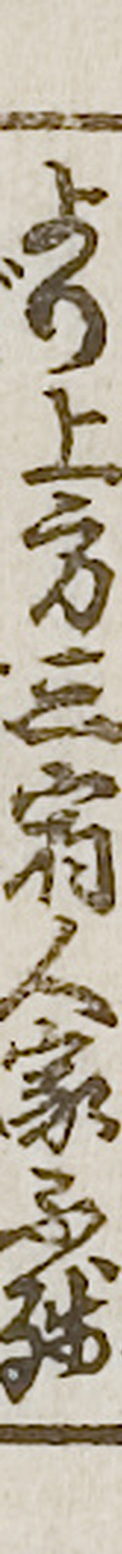より上方三宿人家不残
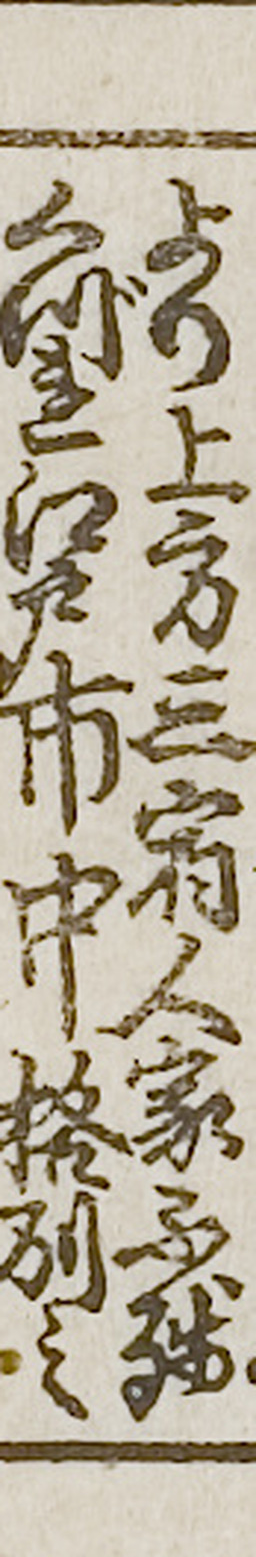くづれ江戸市中格別之
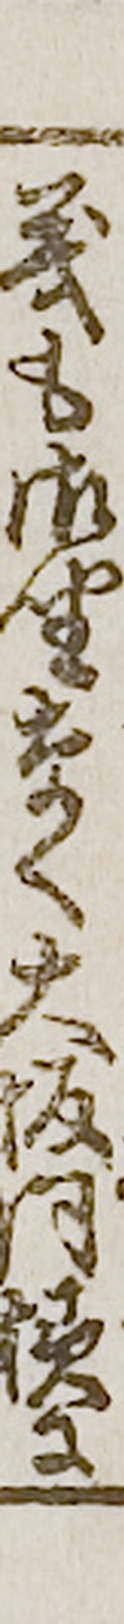義も御座なく大坂同損に
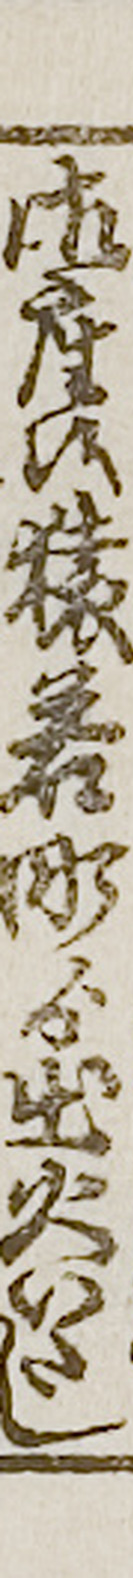御座候猿若町より出火いたし
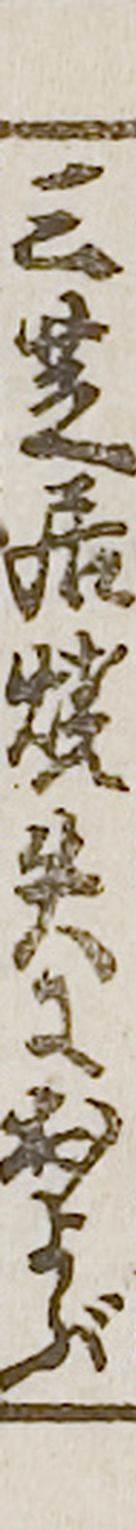三芝居焼失におよぶ
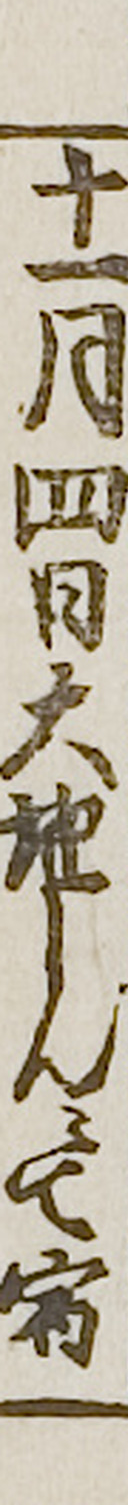十一月四日大地しんにて宿
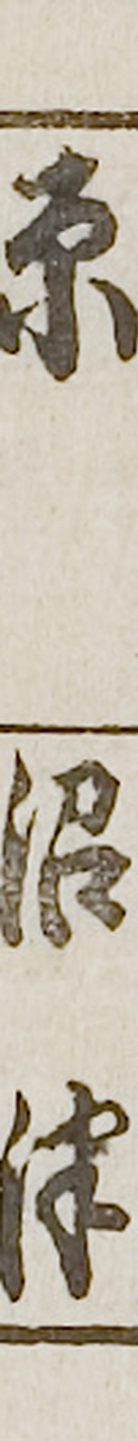原沼津
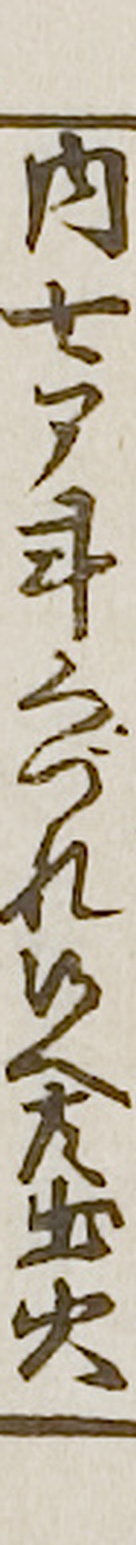内七部斗くつれ候へ共出火
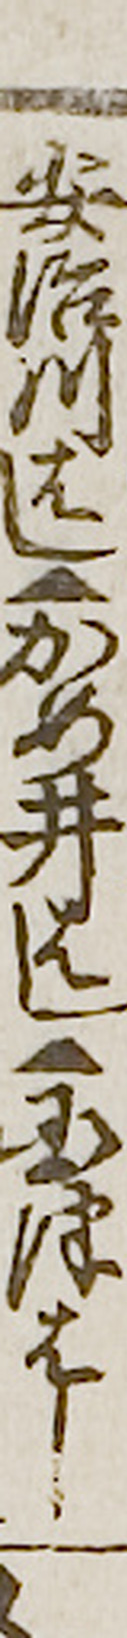安治川はし▲かめ井はし▲国津はし
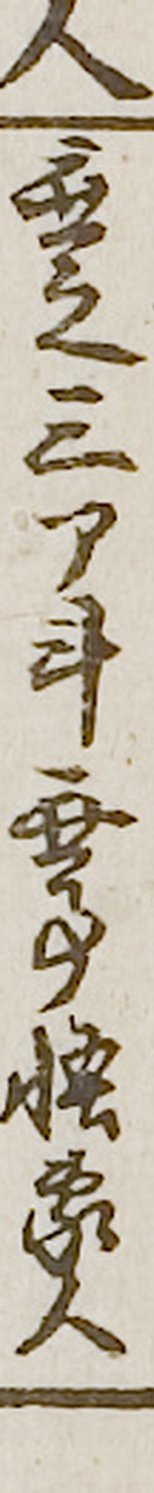無之三部斗無事怪我人
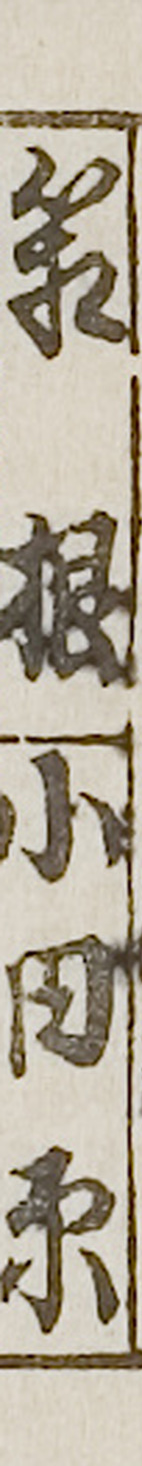箱根小田原
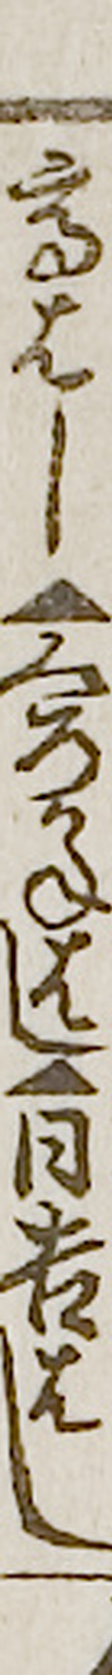高はし▲くろかねはし▲日吉はし
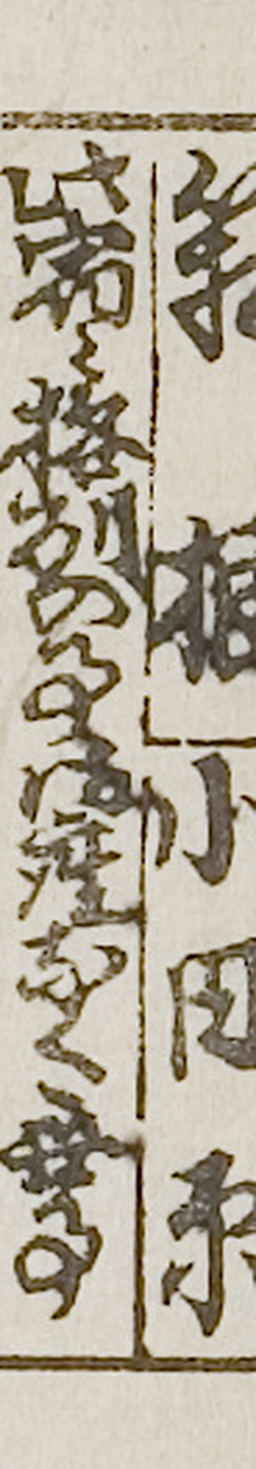此宿々格別之事御座なく無事
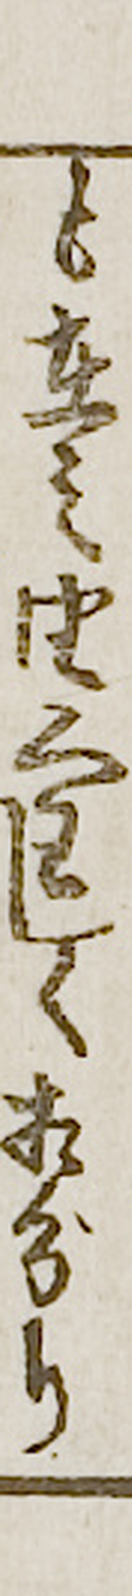も在之由くわしく相分り
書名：大阪大地震一覧
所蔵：東京大学総合図書館 General Library in the University of Tokyo, JAPAN
